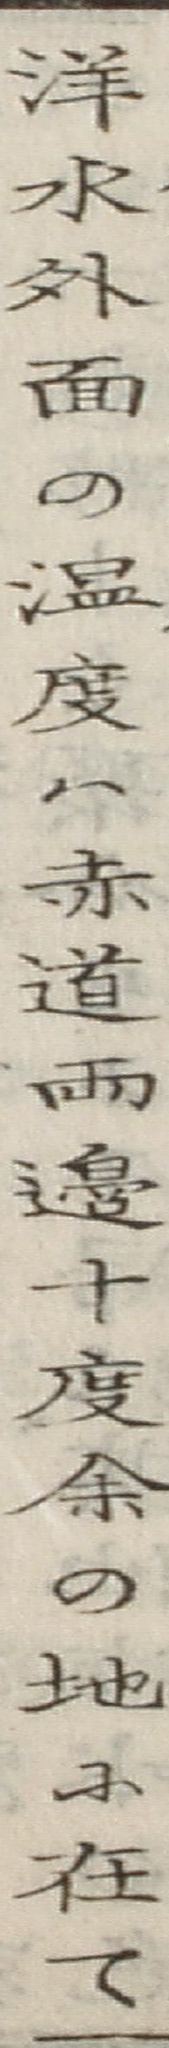洋水外面の温度は、赤道両辺十度余の地に在て、
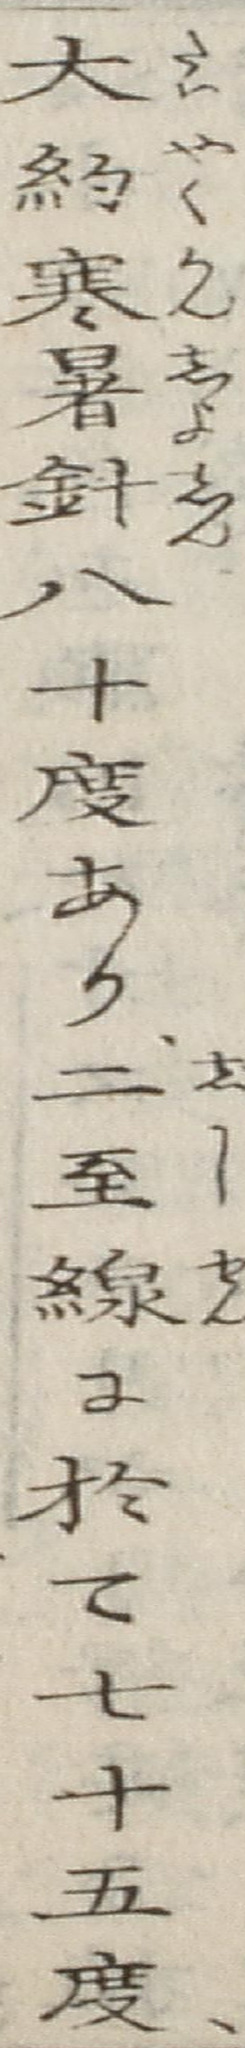大約寒暑針八十度あり、二至線に於て七十五度、
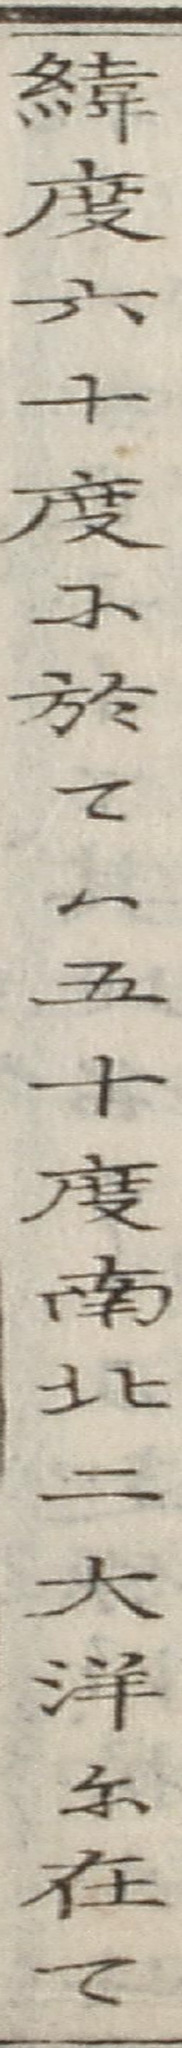緯度六十度に於ては五十度、南北二大洋に在て
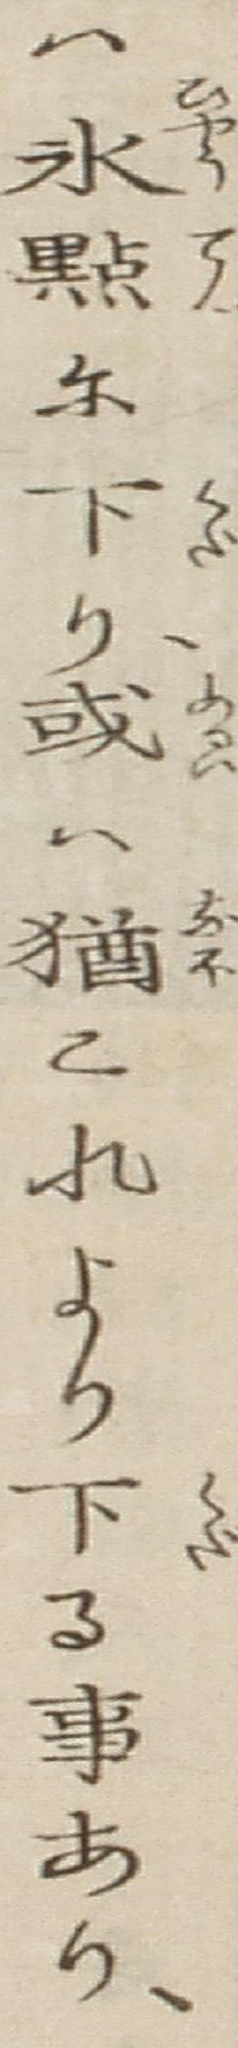は氷点に下り、或は猶これより下る事あり、
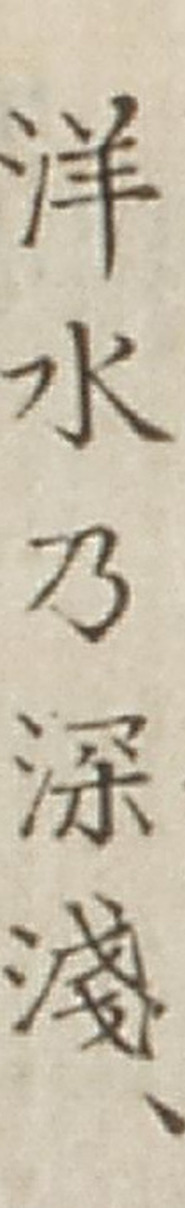洋水乃深浅、
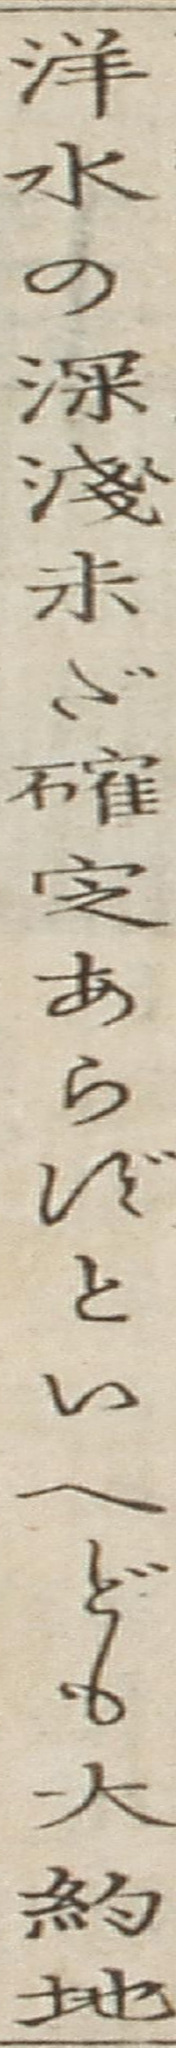洋水の深浅未だ確定あらずといへども、大約地
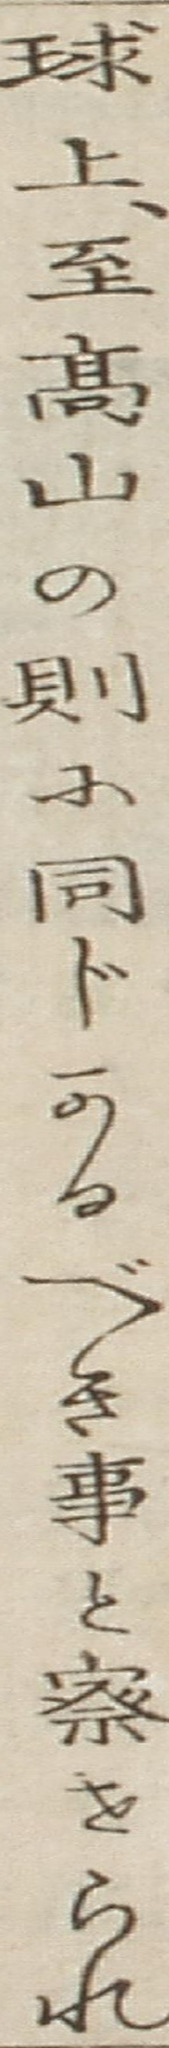球上至高山の則に同じかるべき事と察せられ
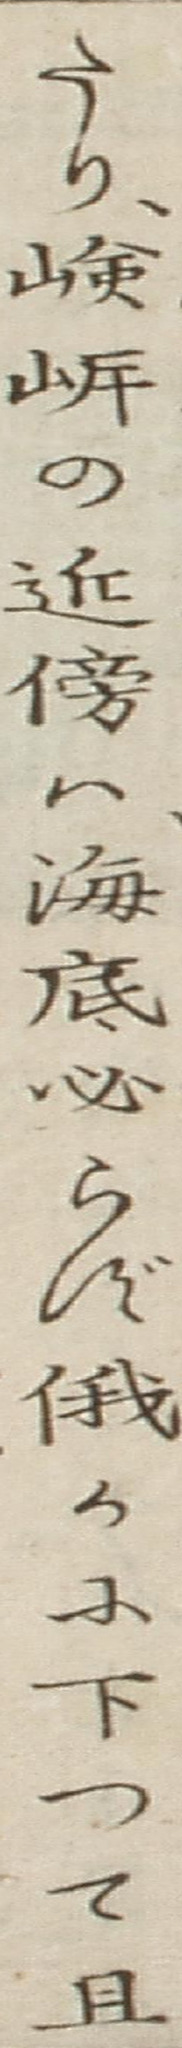たり、嶮岸の近傍は、海底必らず俄かに下つて、且
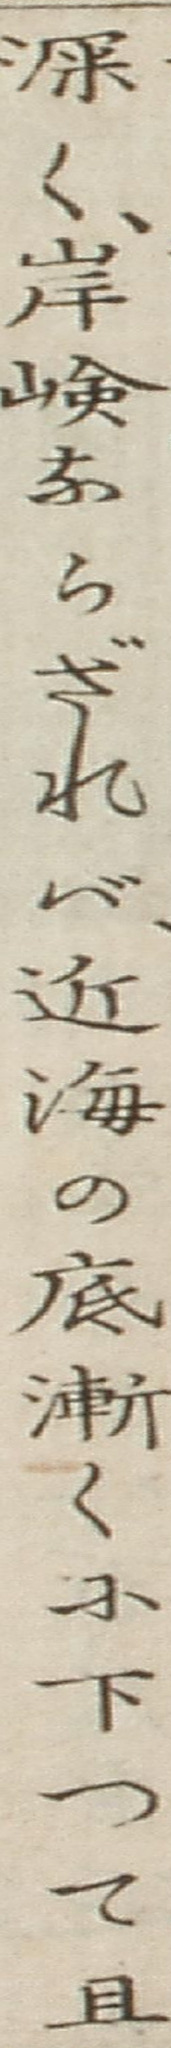深く、岸嶮ならざれば、近海の底漸くに下つて、且
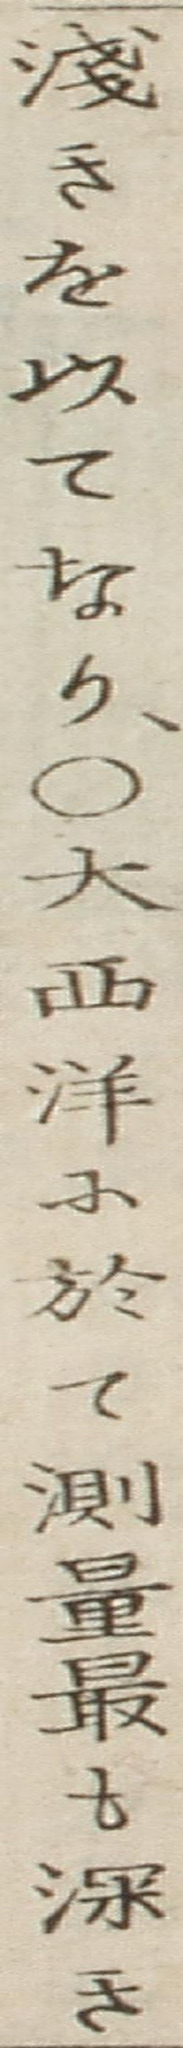浅きを以てなり、○大西洋に於て測量最も深き
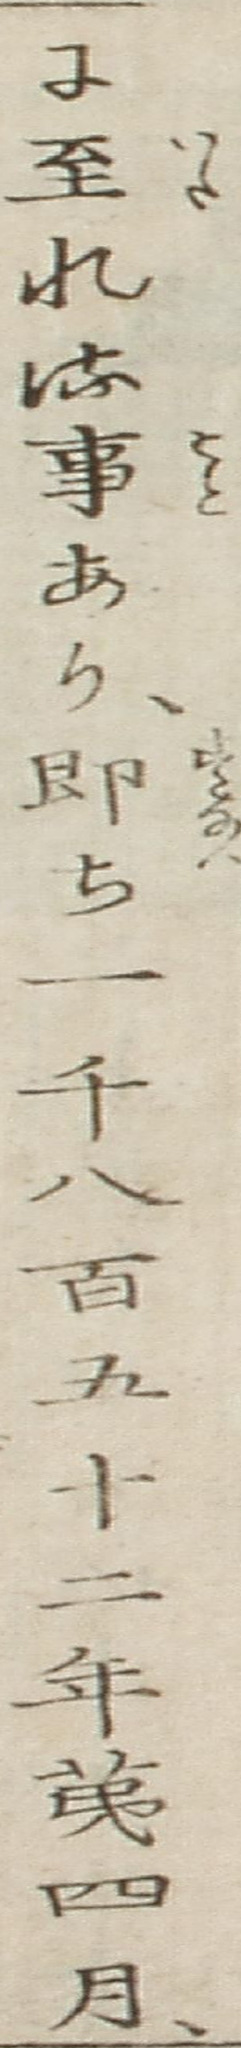に至れる事あり、即ち一千八百五十二年第四月、
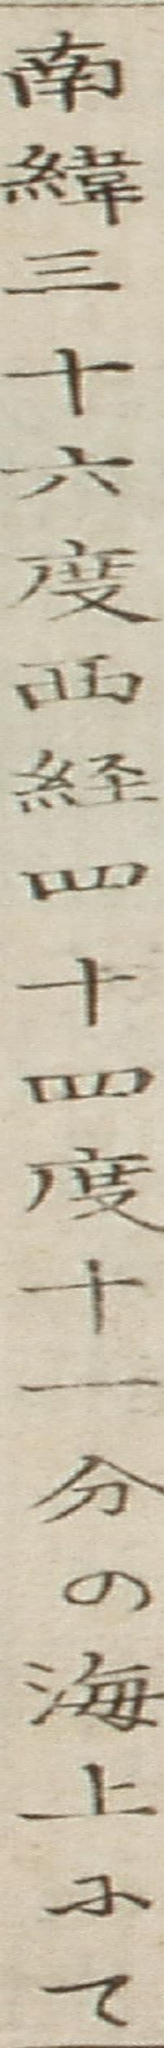南緯三十六度、西経四十四度十一分の海上にて、

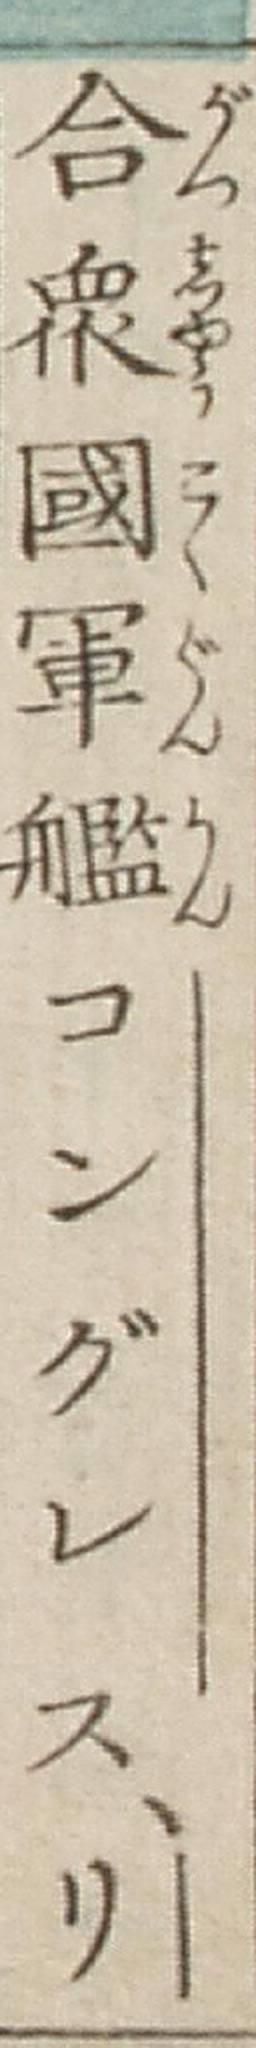合衆国軍艦コングレス、リ
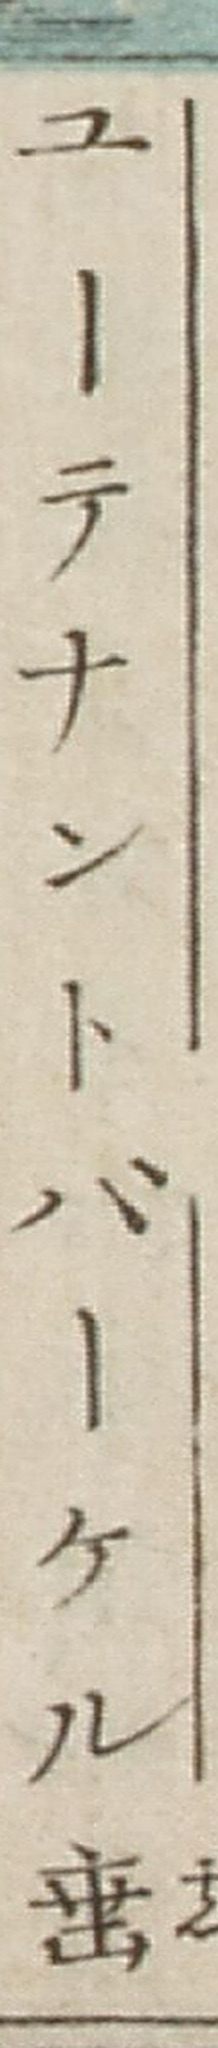ユーテナント、ハーケル垂
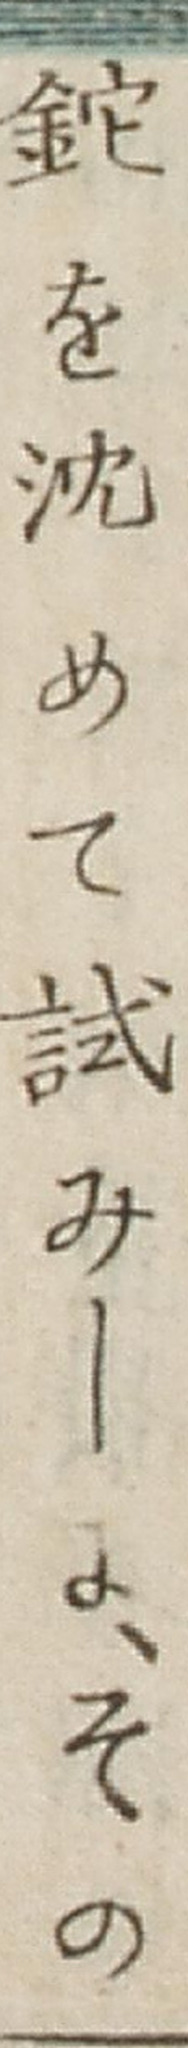鉈を沈めて試みしに、その
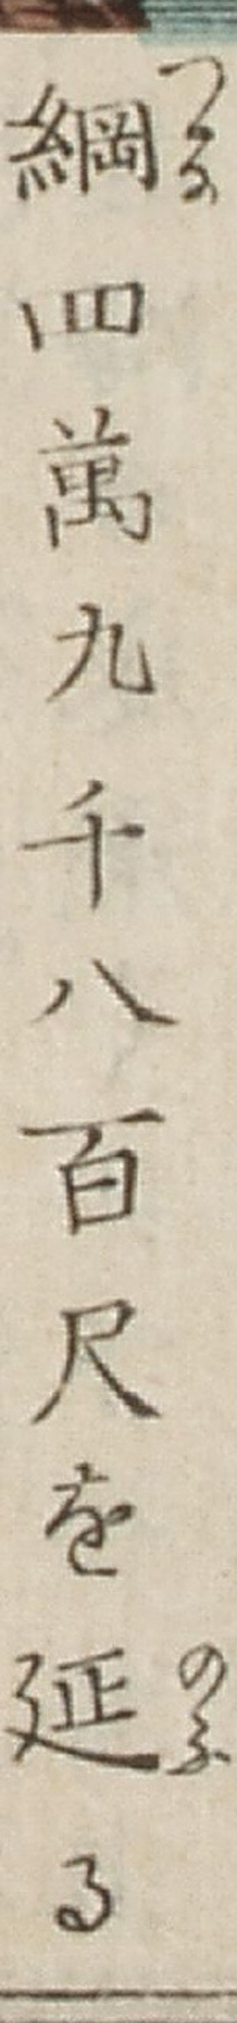綱四万九千八百尺を延る
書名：訓蒙　天然地理學　中
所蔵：東京大学地震研究所図書室 Earthquake Research Institute Library, The University of Tokyo, JAPAN
